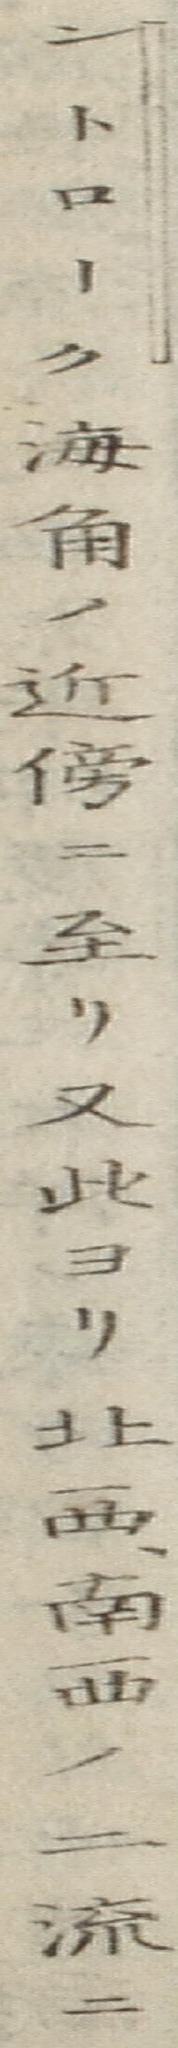ントローク海角ノ近傍ニ至リ又此ヨリ北西、南西ノ二流ニ
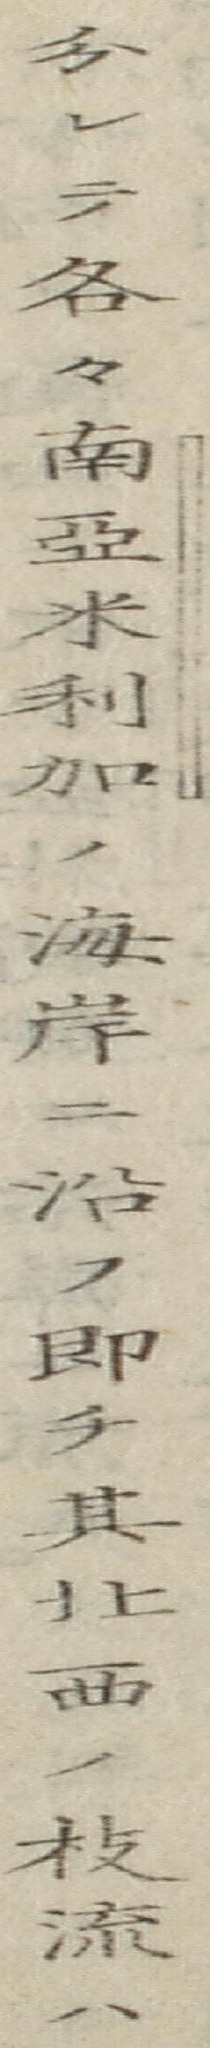分レテ各々南亜米利加ノ海岸ニ沿フ即チ其北西ノ枝流ハ
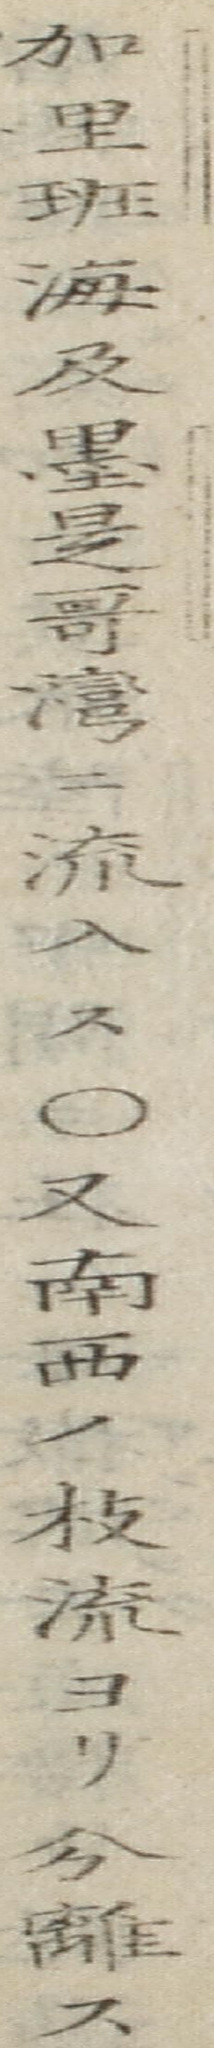加里班海及墨是哥湾ニ流入ス○又南西ノ枝流ヨリ分離ス
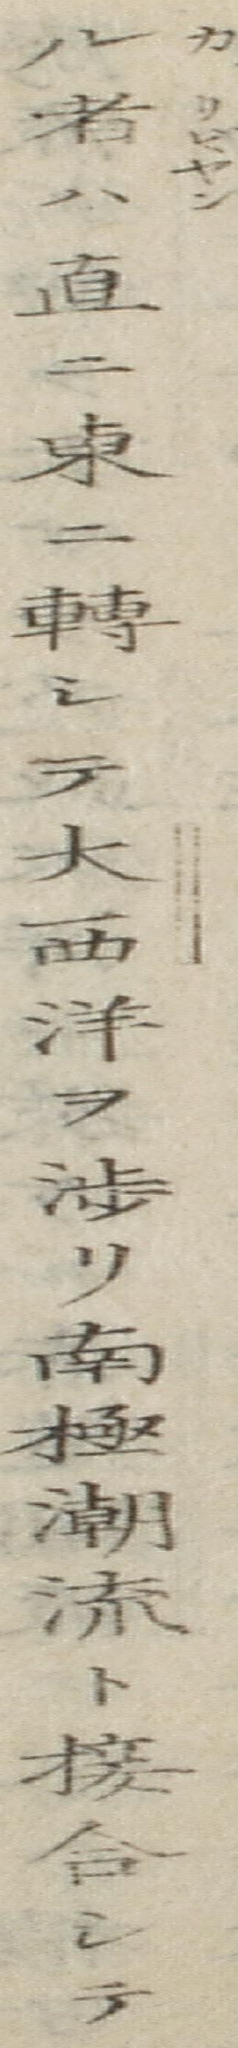ル者ハ直ニ東ニ転シテ大西洋ヲ渉リ南極潮流ト接合シテ
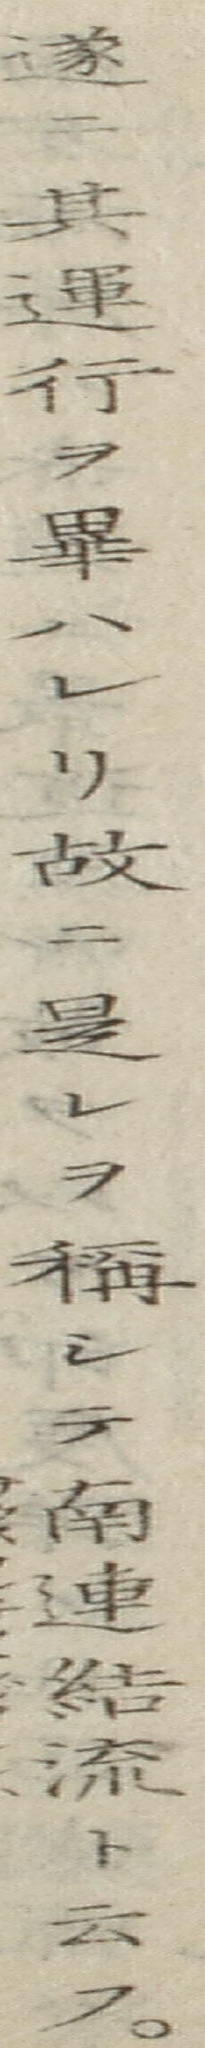遂ニ其運行ヲ畢ハレリ故ニ是レヲ稱シテ南連結流ト云フ。
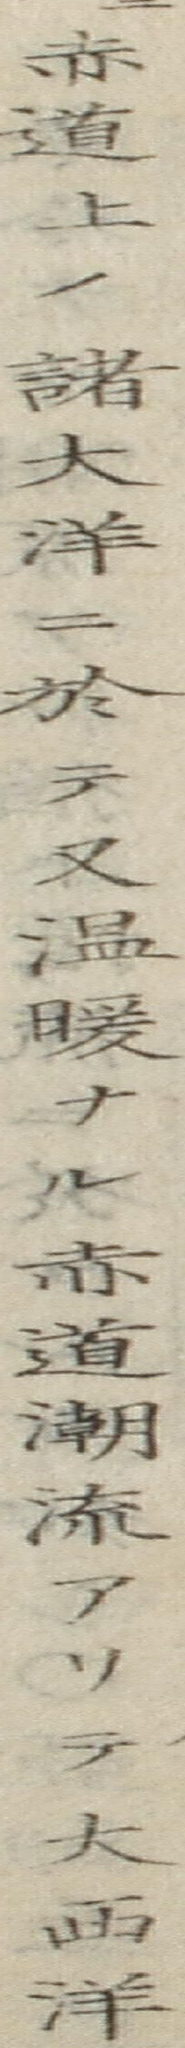卅二赤道上ノ諸大洋ニ於テ又温暖ナル赤道潮流アリテ大西洋
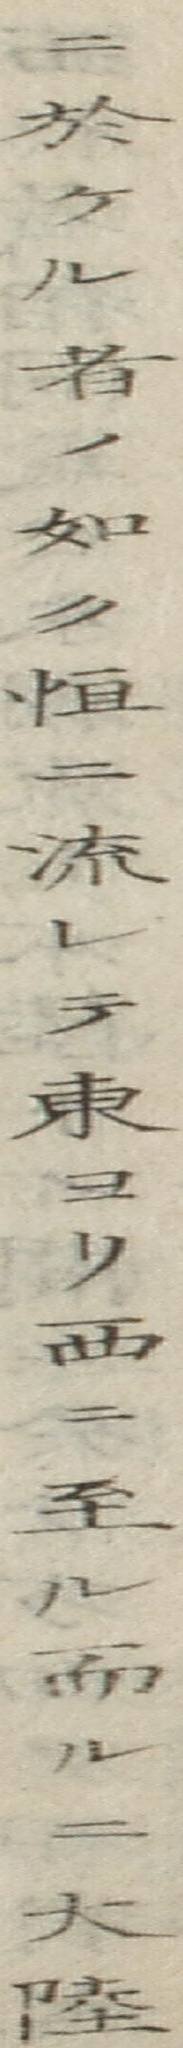ニ於ケル者ノ如ク恒ニ流レテ東ヨリ西ニ至ル而ルニ大陸
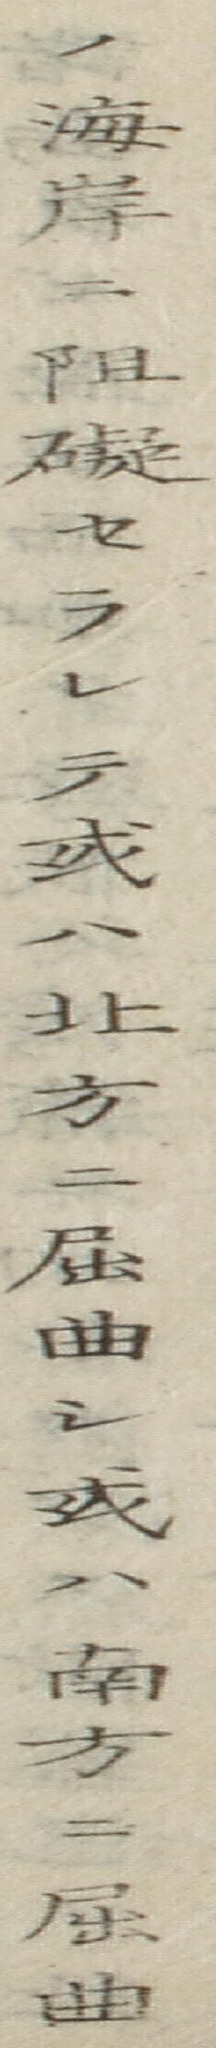ノ海岸ニ阻礙セラレテ或ハ北方ニ屈曲シ或ハ南方ニ屈曲
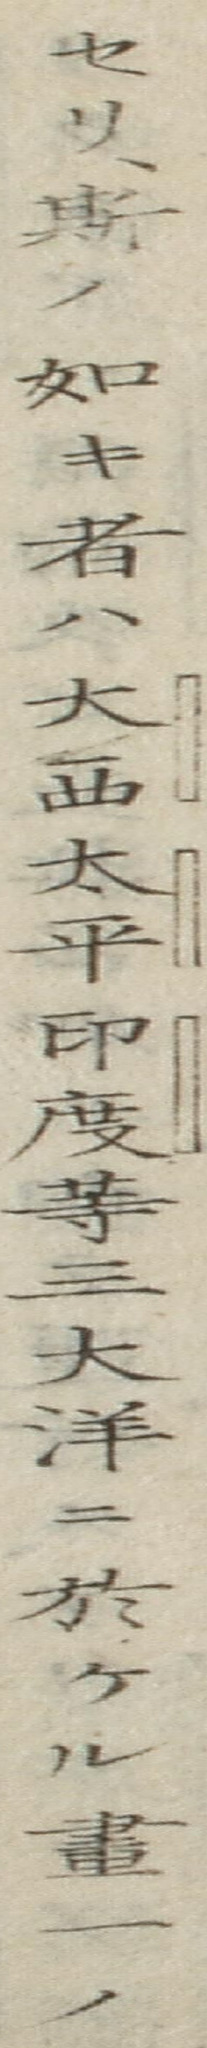セリ、斯ノ如キ者ハ大西太平印度等三大洋ニ於ケル畫一ノ
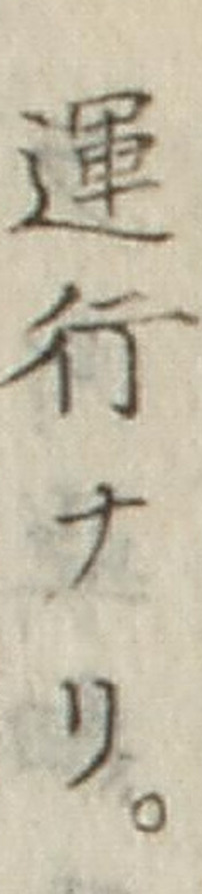運行ナリ。
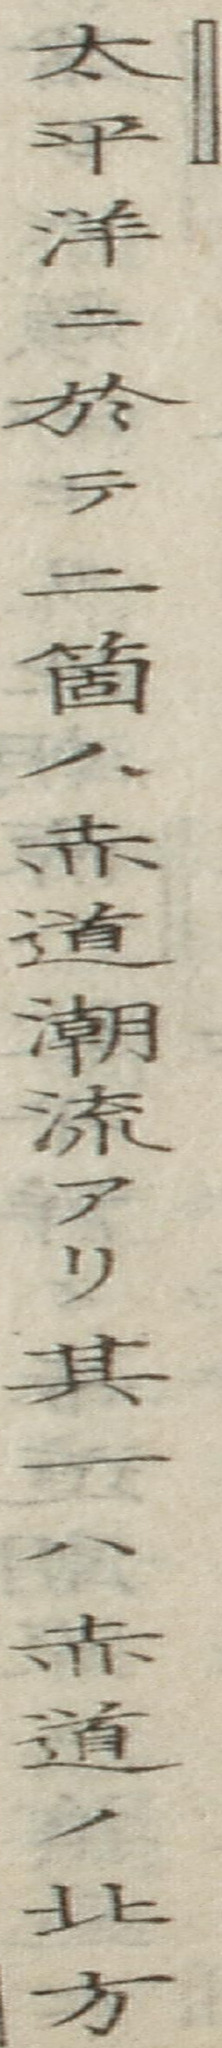太平洋ニ於テニ箇ノ赤道潮流アリ其一ハ赤道ノ北方
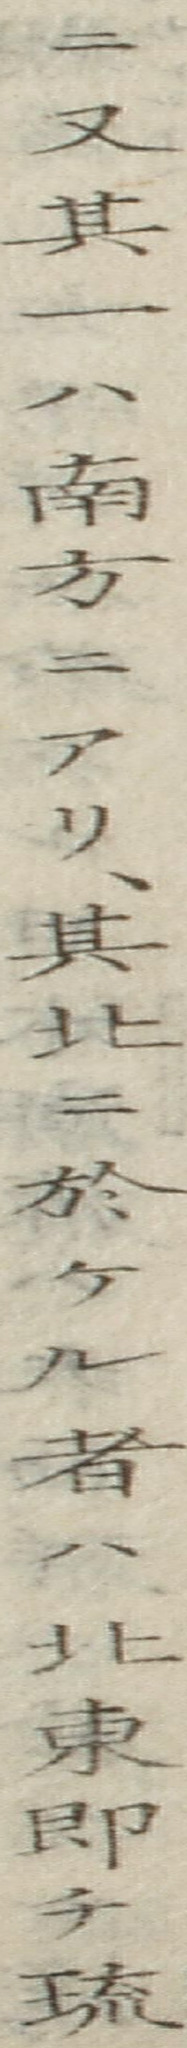ニ又其一ハ南方ニアリ、其北ニ於ケル者ハ北東即チ琉
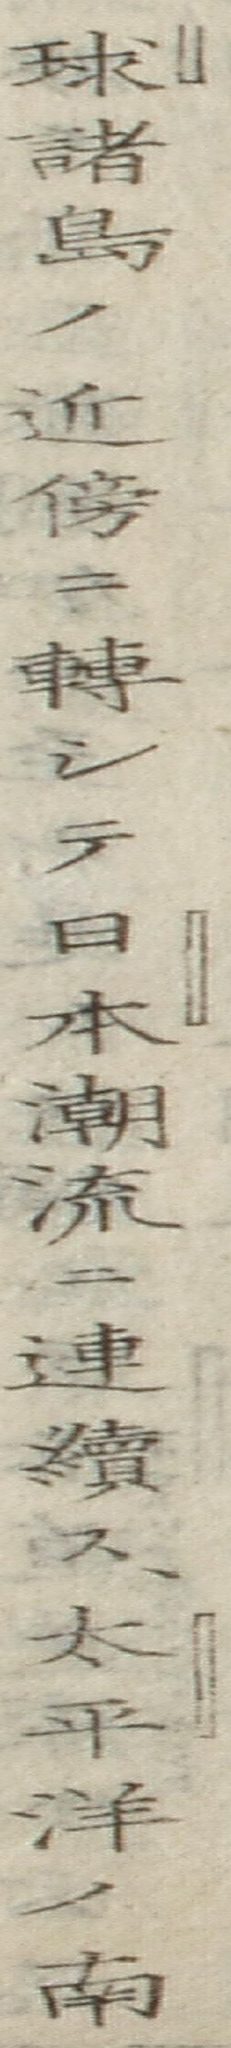球諸島ノ近傍ニ転シテ日本潮流ニ連続ス、太平洋ノ南
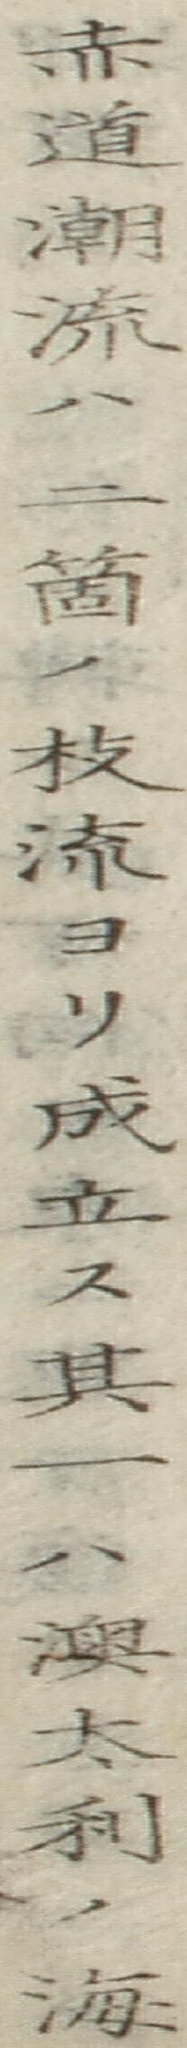赤道潮流ハニ箇ノ枝流ヨリ成立ス其一ハ澳太利ノ海
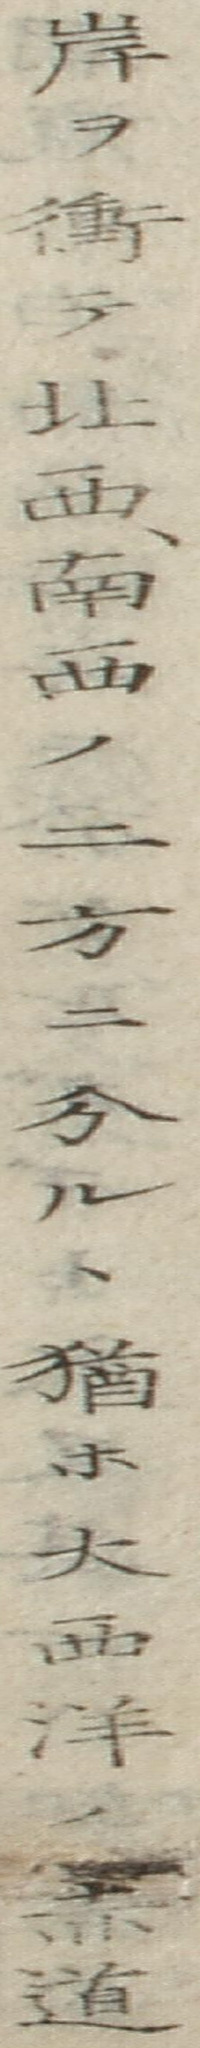岸ヲ衝テ北西、南西ノ二方ニ分ルヽ猶ホ大西洋ノ赤道

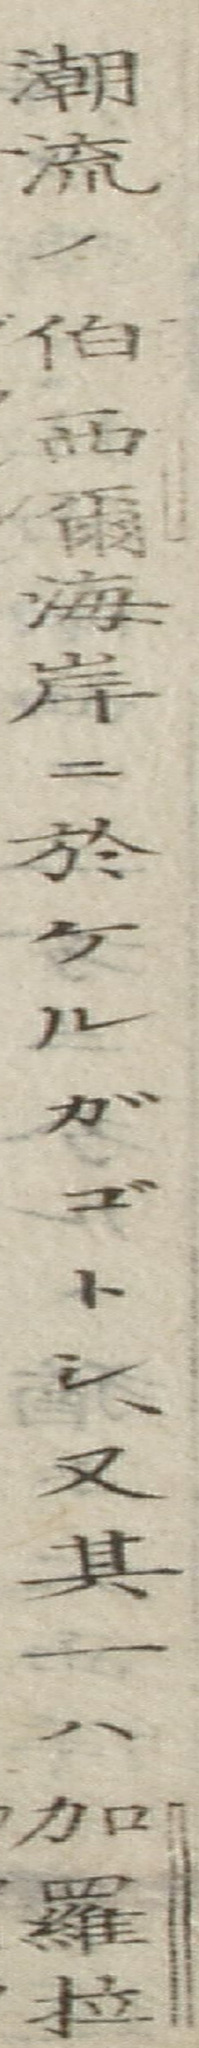潮流ノ伯西爾海岸ニ於ケルガゴトシ、其一ハ加羅拉
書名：地形論　巻二
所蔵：東京大学地震研究所図書室 Earthquake Research Institute Library, The University of Tokyo, JAPAN
